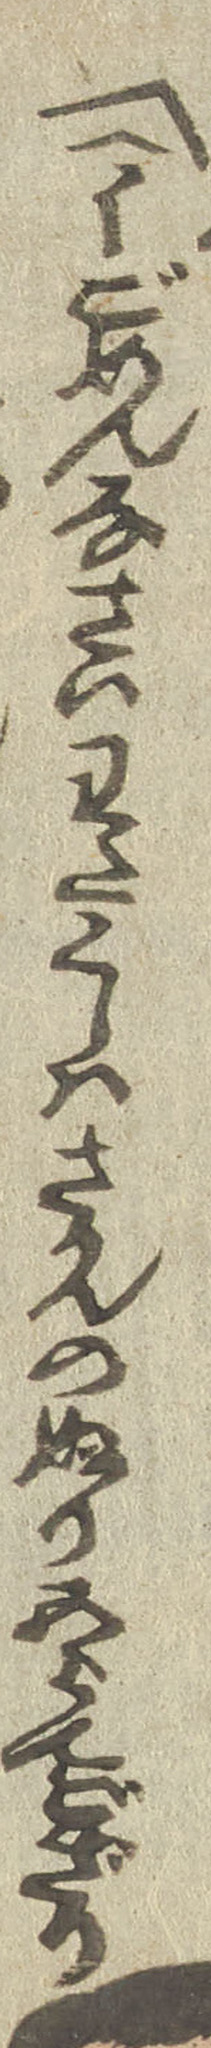「ヘイごめんなさいわたくしはぬり五郎てござり
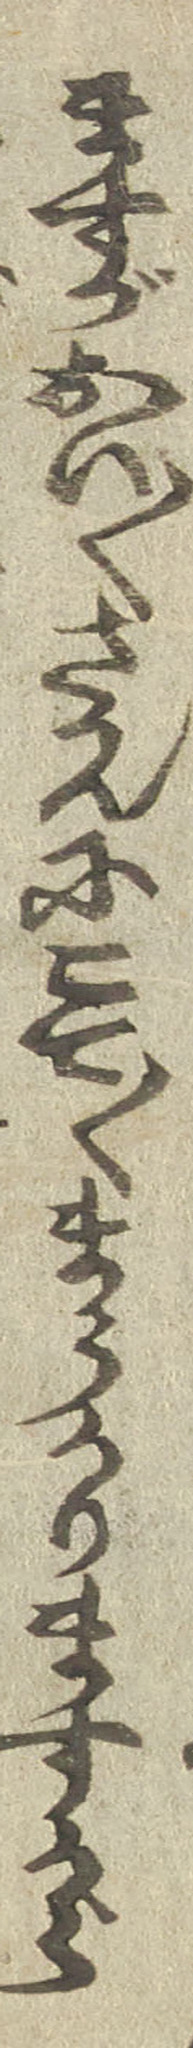ますがおい〳〵さかんにこて〳〵まうかりますから
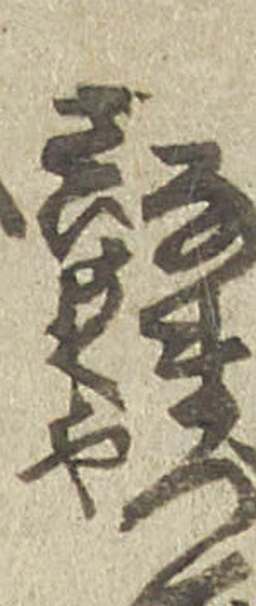ざいもくや
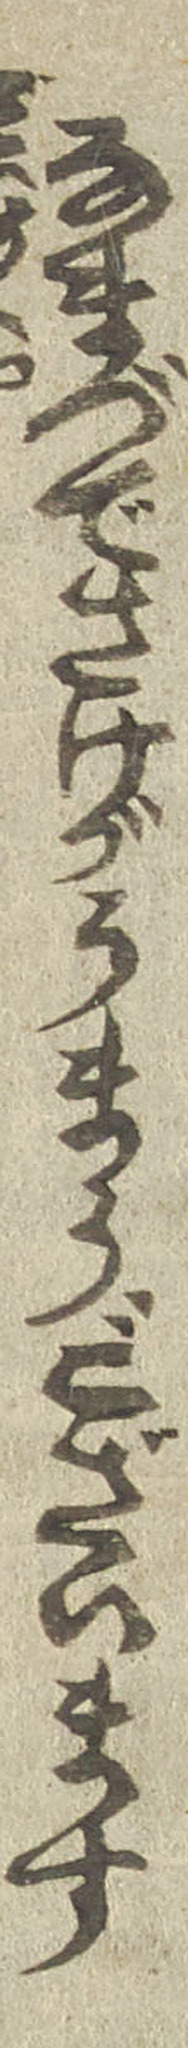なまづでさけがうまうございます
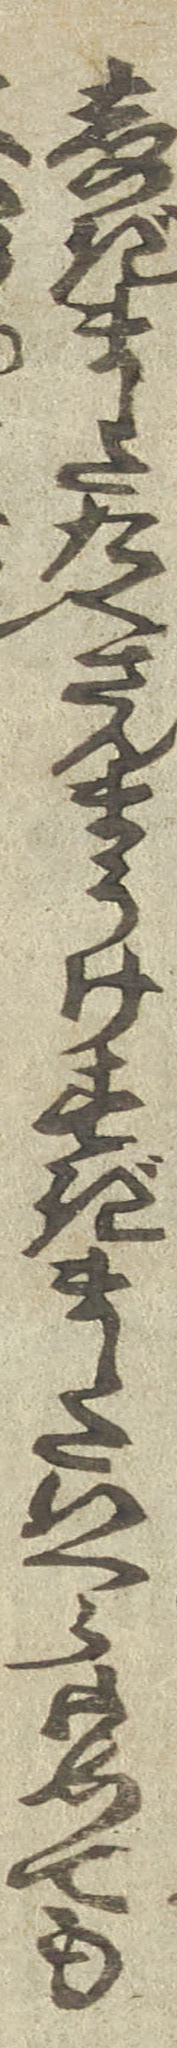しのぎましたたくさんまうけすぎましたいくらもめても
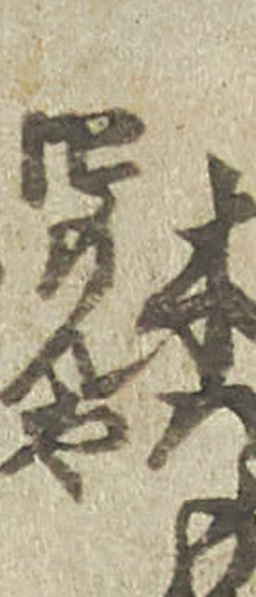四もんや
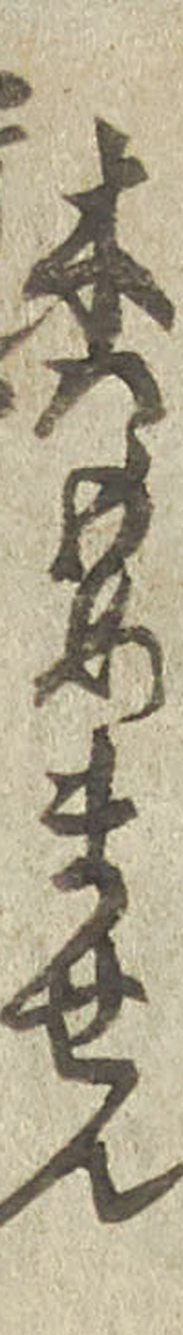木はもめません
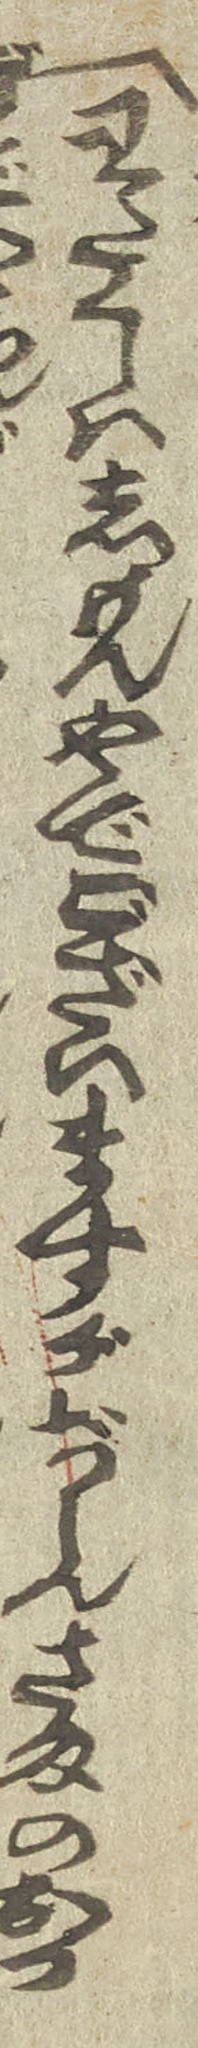「わたくしはしもんやでございますがぢしんさまおか
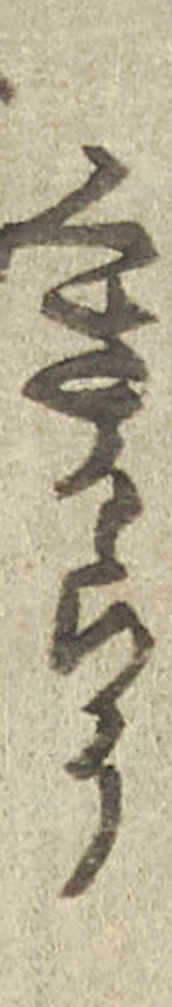くさからう
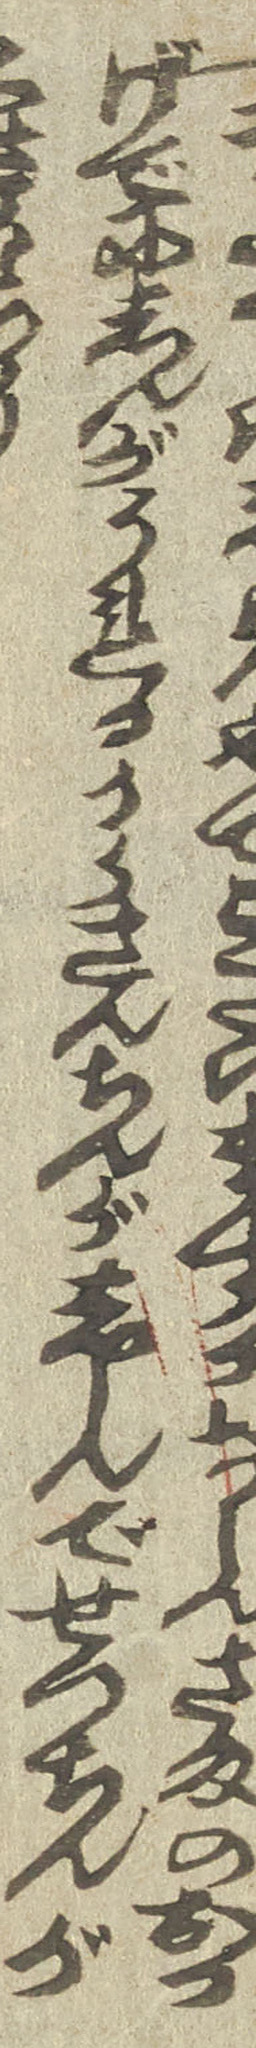げでにしんがうれるからさんちんがししんでせつちんが
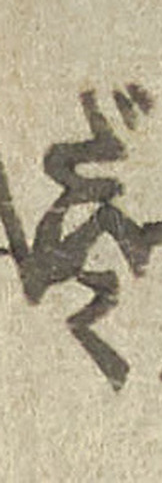だいく
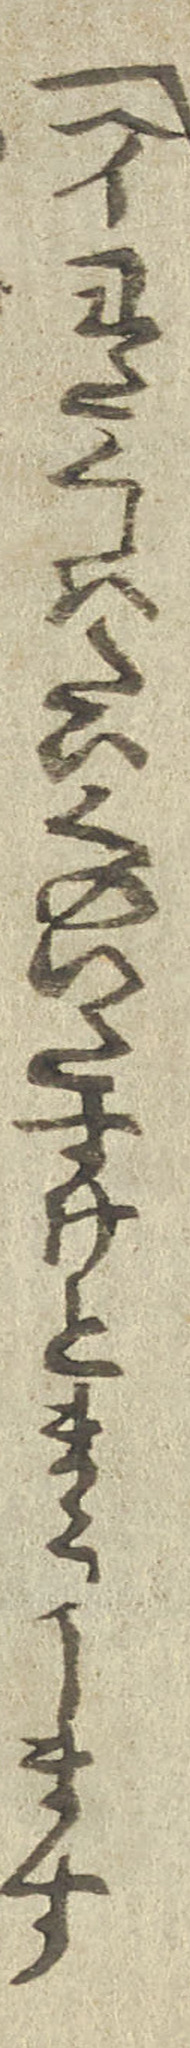「ヘイわたくしはたいくのいたすけとまうします
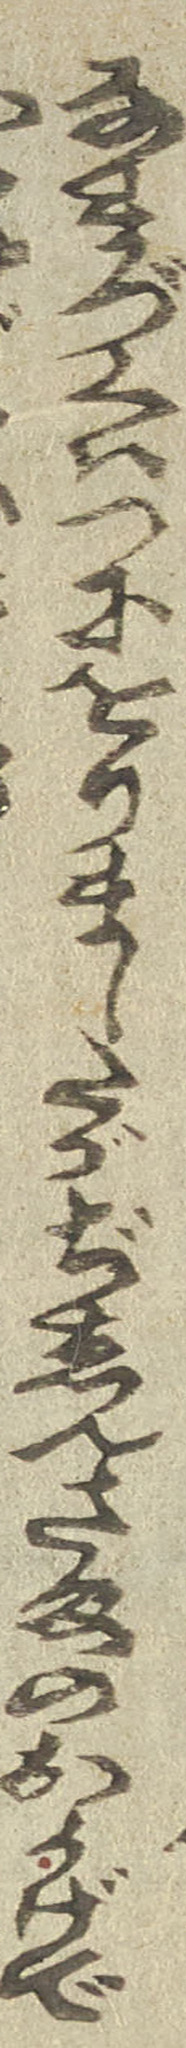なまづくはつにおりましたがぢしんさまのおかげで
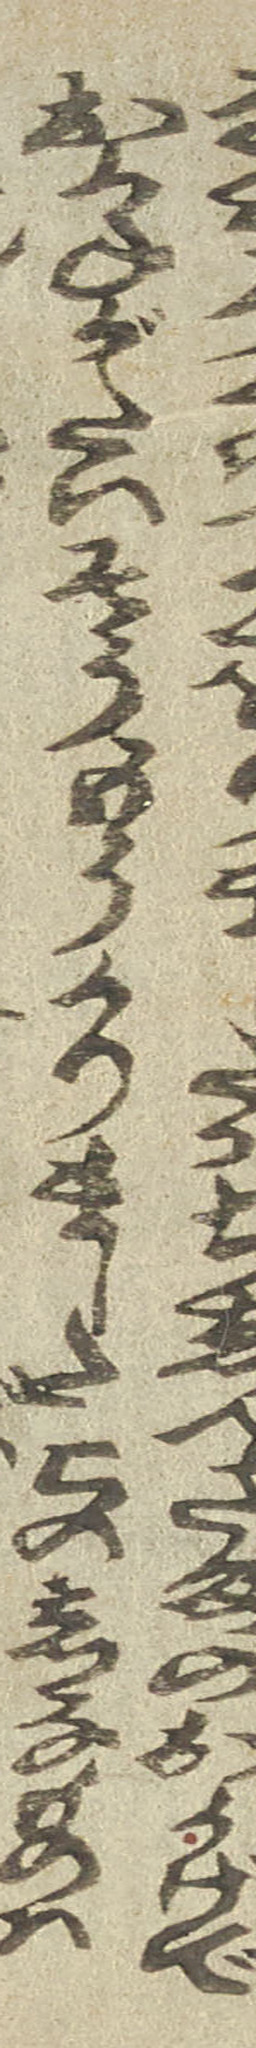おかねがたいそうもうかりましたこのしなものは
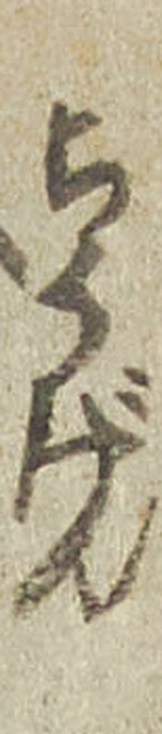ちうげん
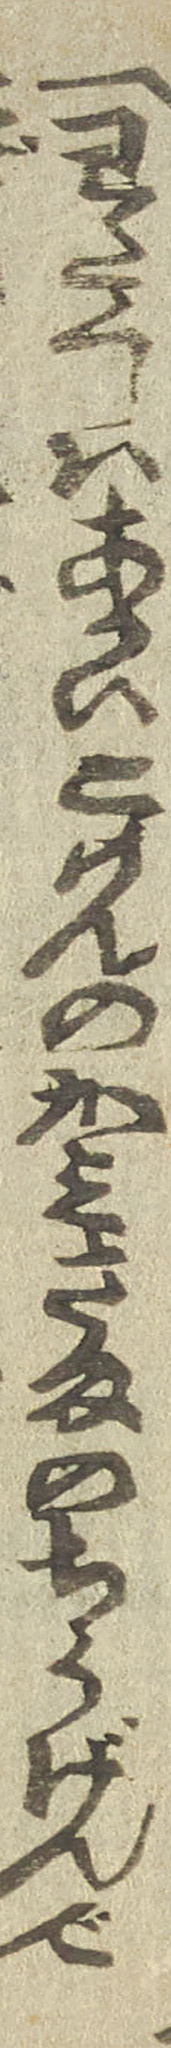「わたくしはあかいこもんのかみさまのちうげんで
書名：[病気鯰に諸職人見舞の図]
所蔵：東京大学総合図書館 General Library in the University of Tokyo, JAPAN
